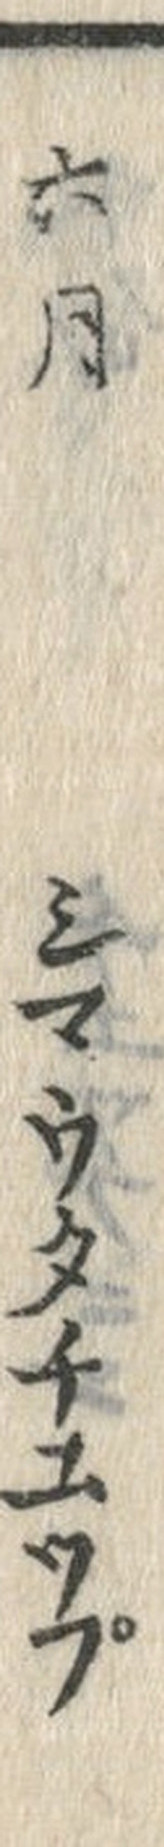六月シマウタチユツプ
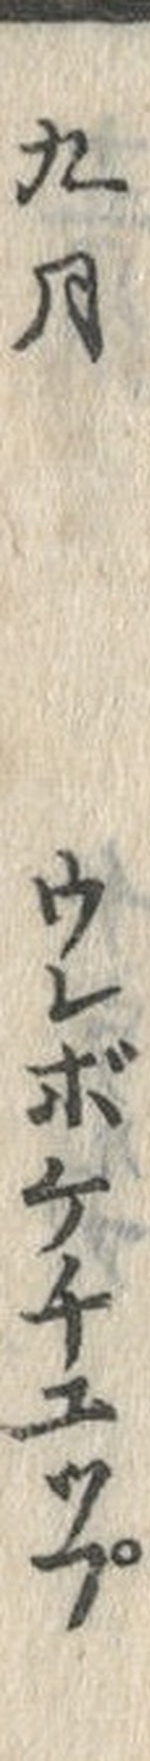九月ウンボケチユツプ

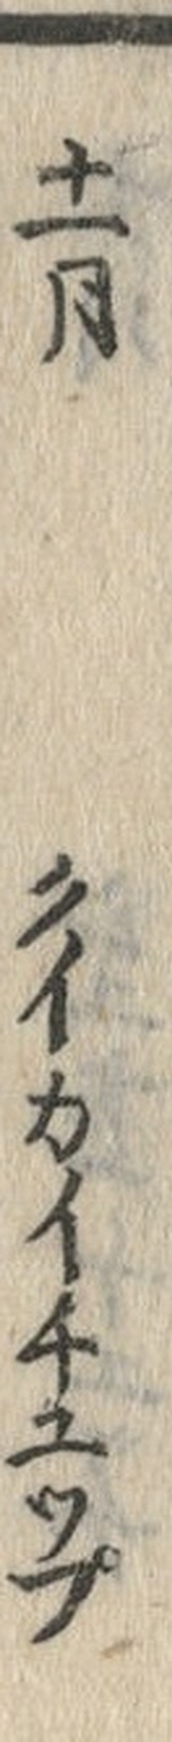十一月クイカイチユツプ
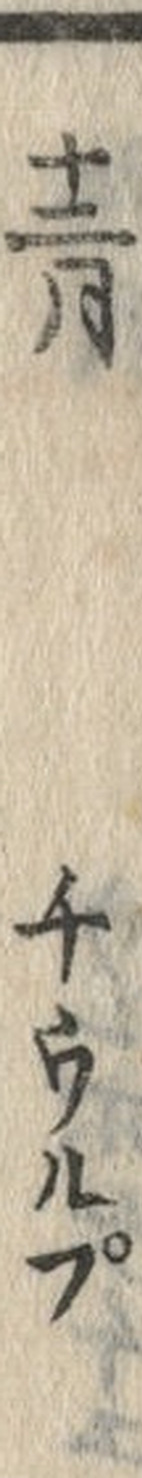十二月チウルプ
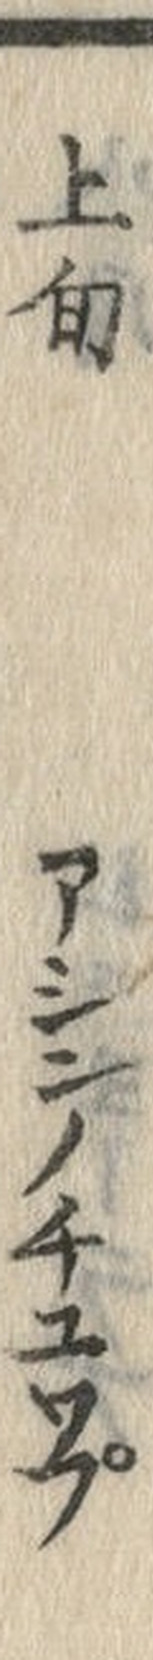上旬アシンノチユツプ
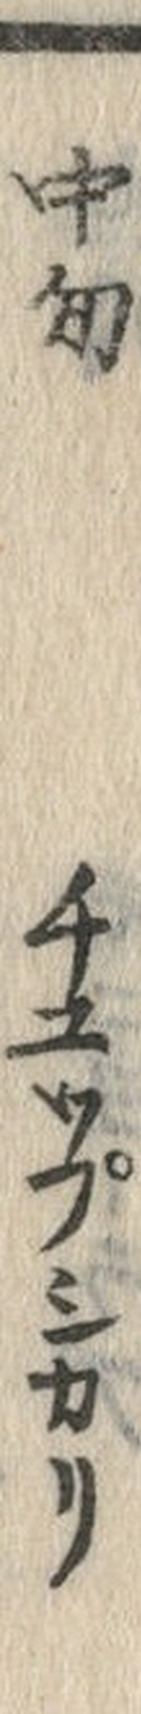中旬チユツプシカリ
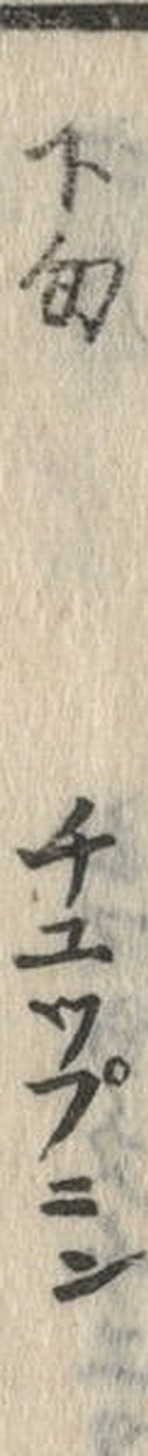下旬チユツプニン
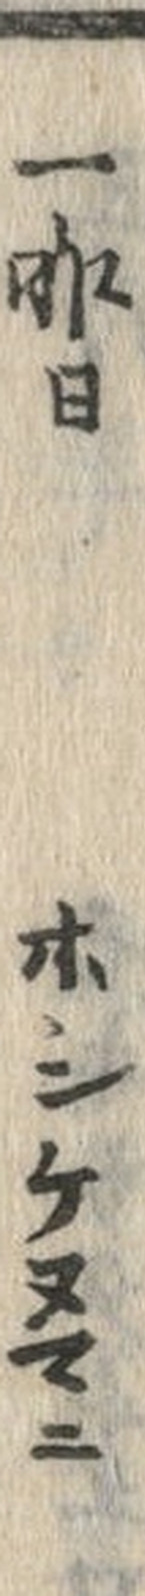一昨日ホシケヌマニ
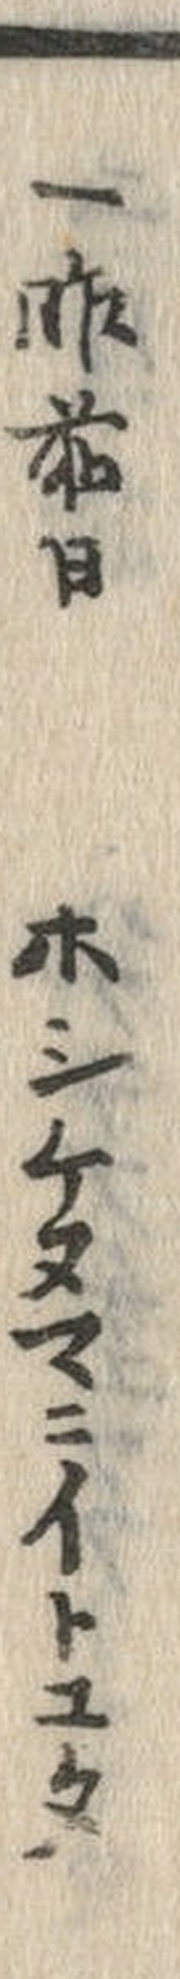一昨前日ホシケヌマニイトユタ
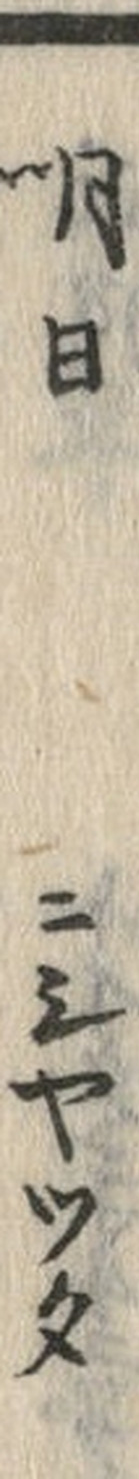明日ニシヤツタ
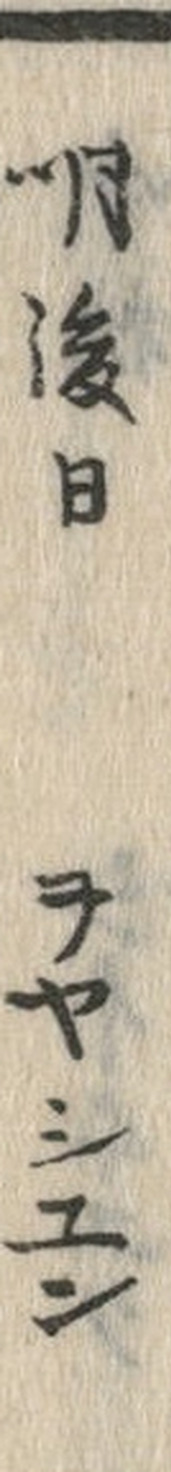明後日ヲヤシユン
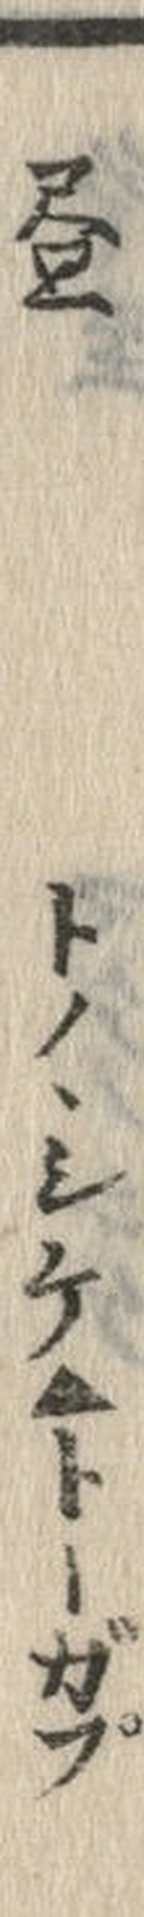昼トノヽシケ▲トーガプ

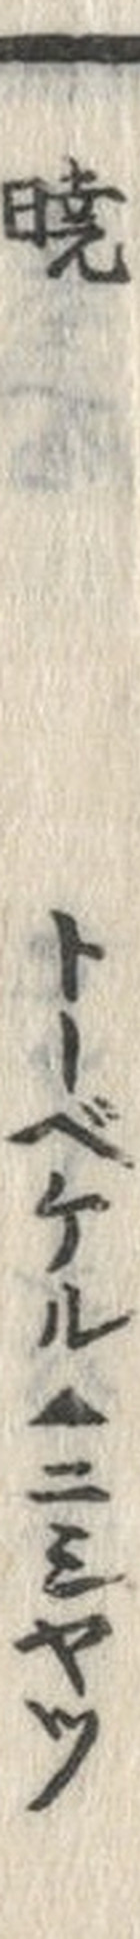暁トーベケル▲ニシヤツ
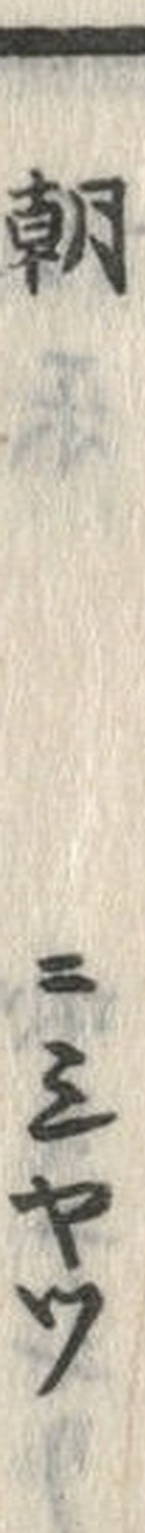朝ニシヤツ
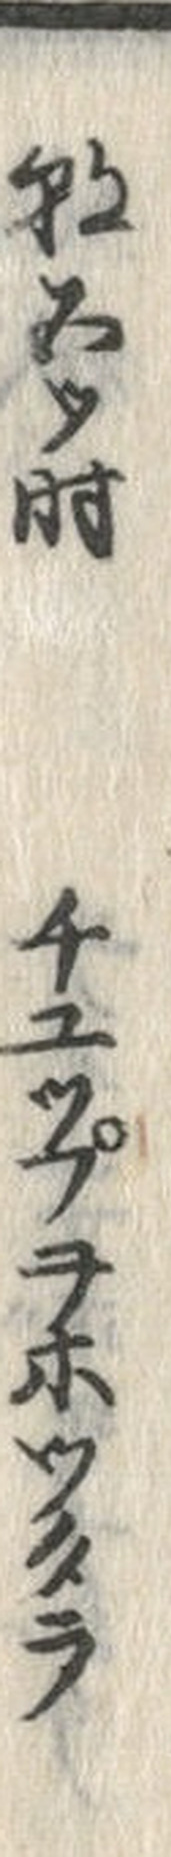朝五ツ時チユツプヲホツタラ
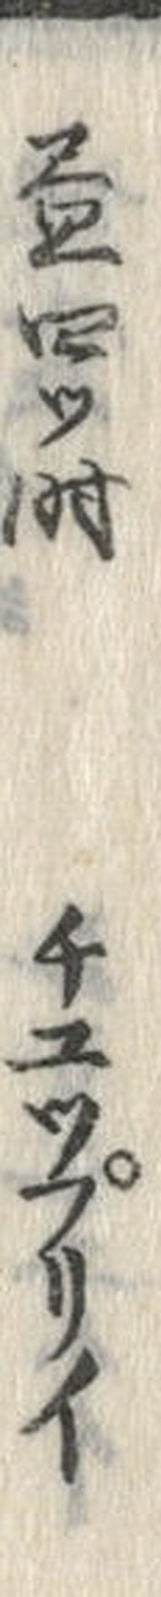昼四ツ時チユツプリイ
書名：蝦夷方言藻汐草　乾巻
